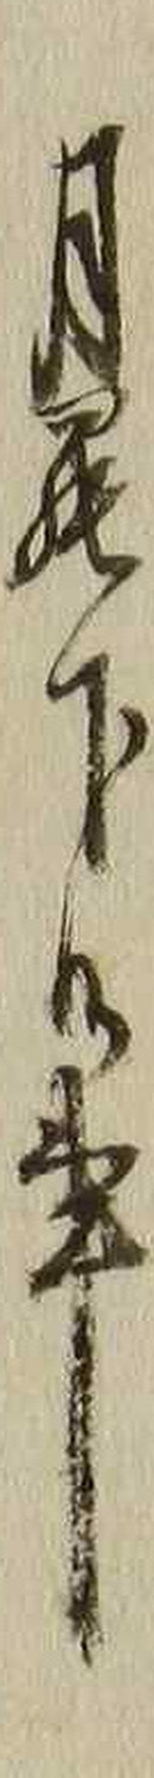月罷下候事
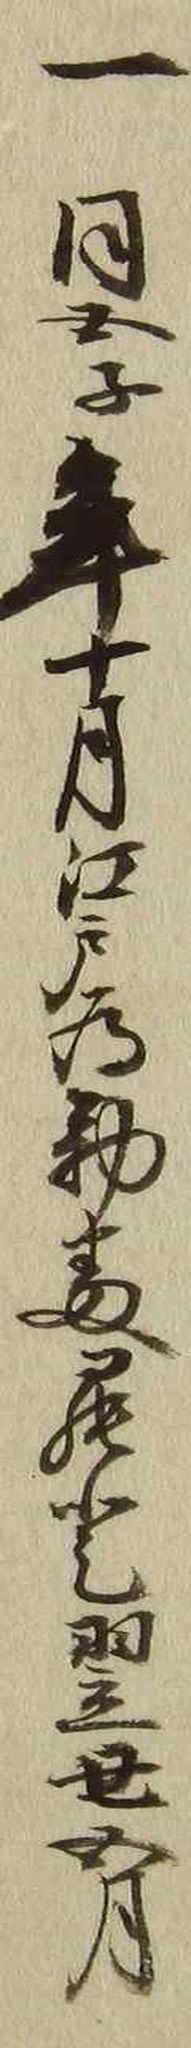一同五子年十月江戸為勤番罷登翌丑五月
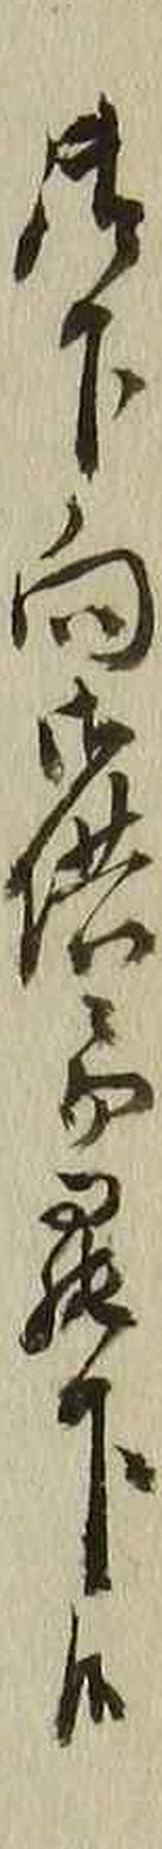御下向御供ニ而罷下候
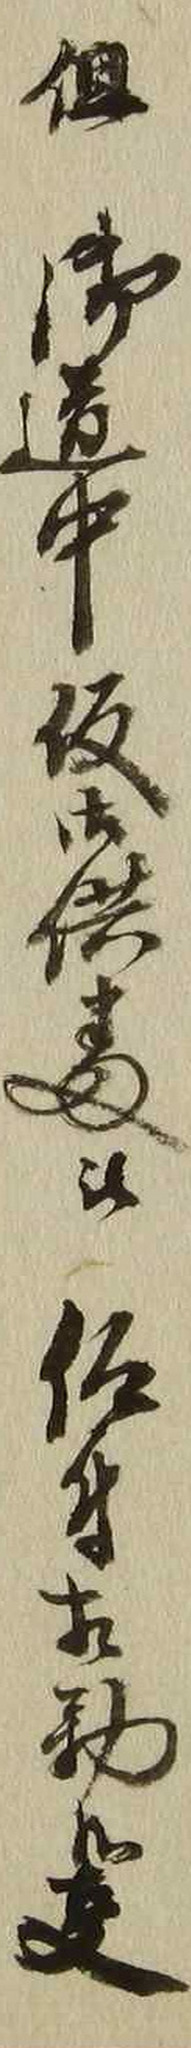但御道中仮御供番被仰付相勤候事
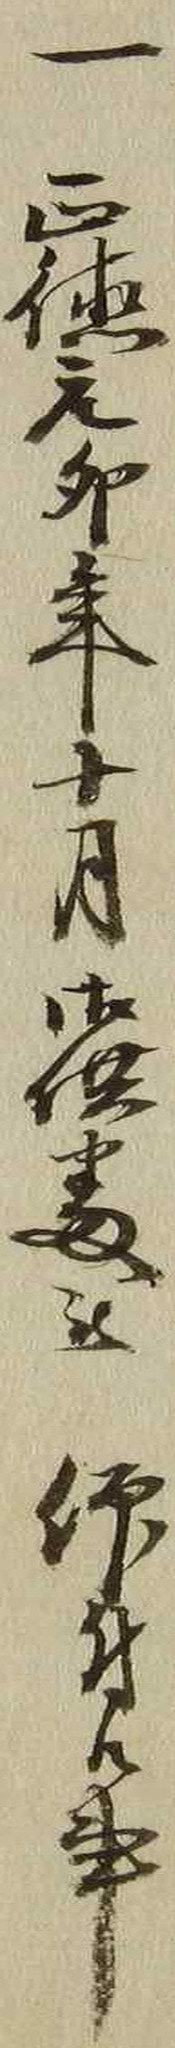一正徳元卯年十月御供番被仰付候事
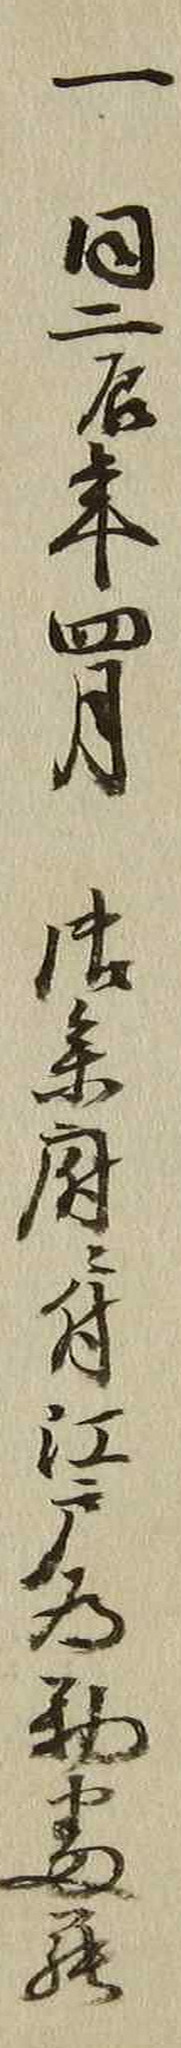一同二辰年四月御参府ニ付江戸為勤番罷
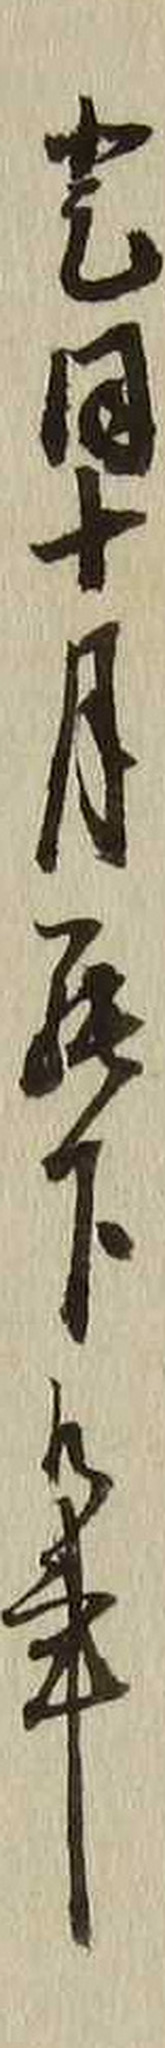登同十月罷下候事
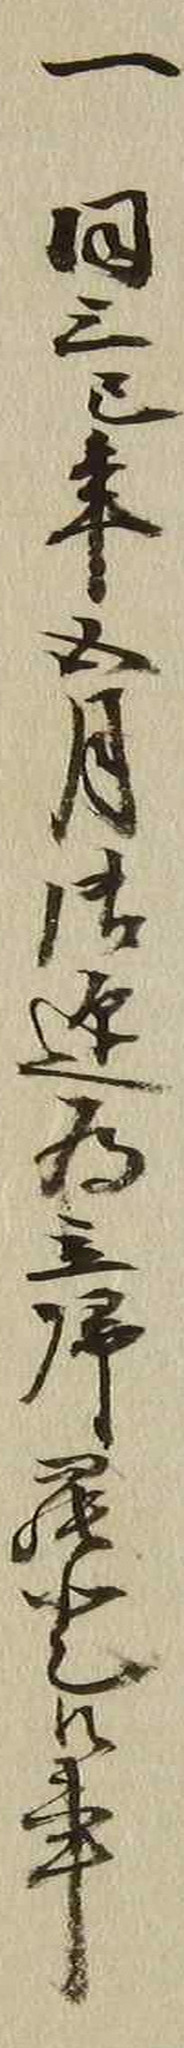一同三巳年五月御迎為立帰罷登候事
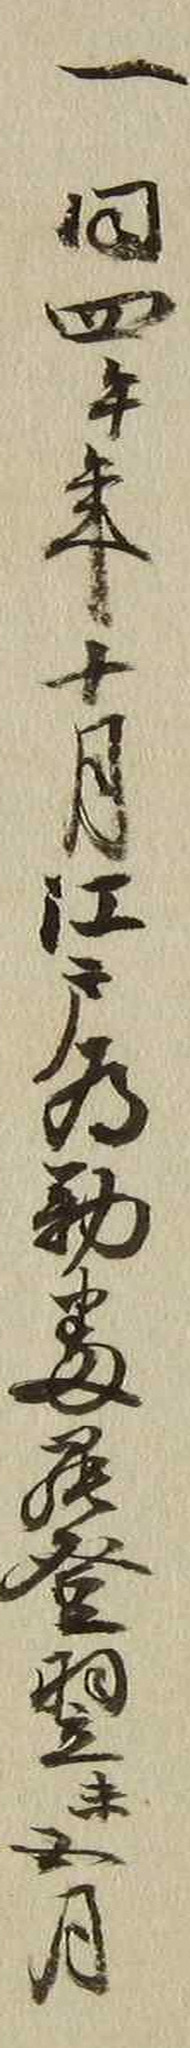一同四午年十月江戸為勤番罷登翌未五月
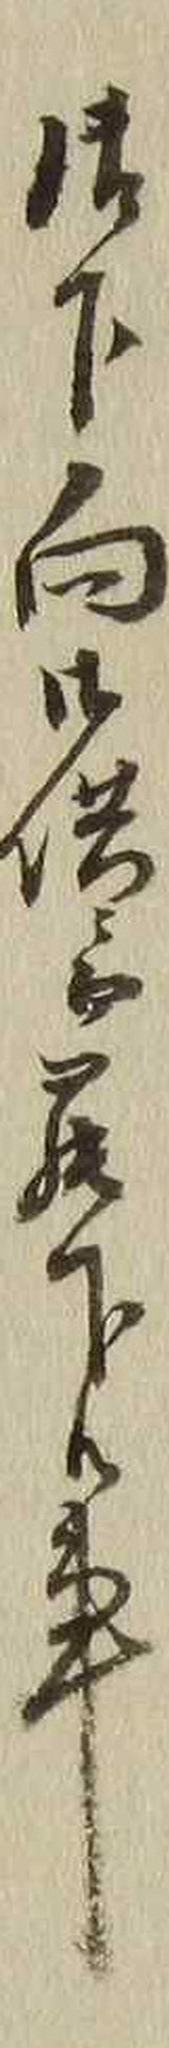御下向御供ニ而罷下候事
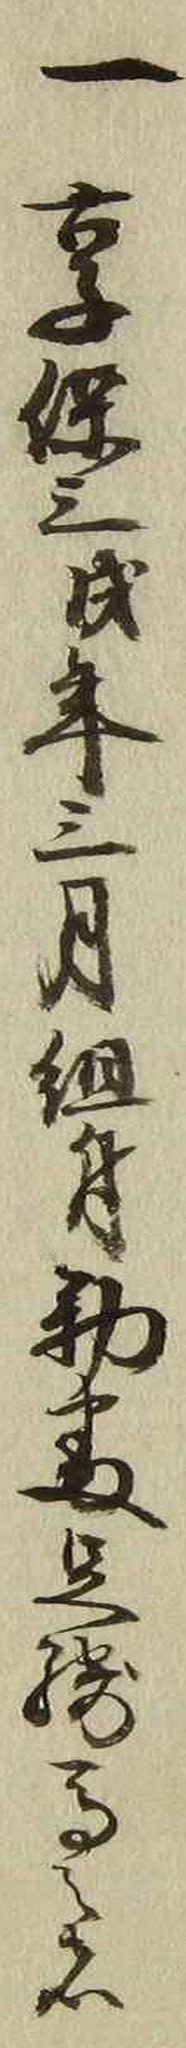一享保三戌年三月組付勤番足勝馬之者
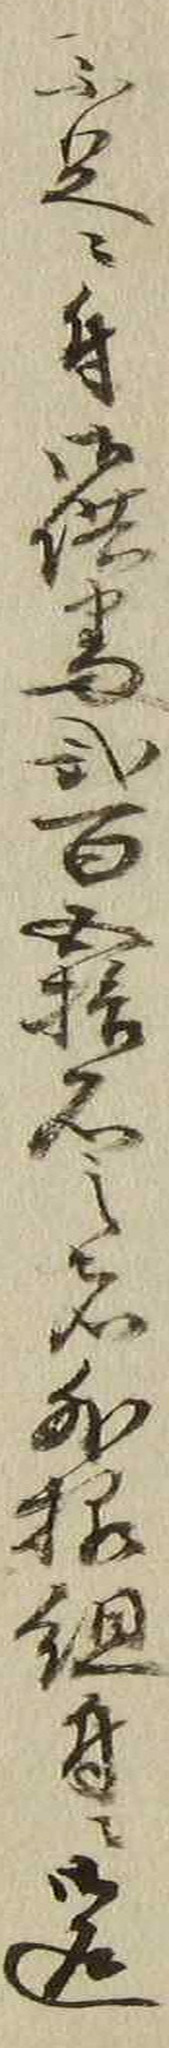不足ニ付御供番弐百五拾石之者外様組付ニ御返
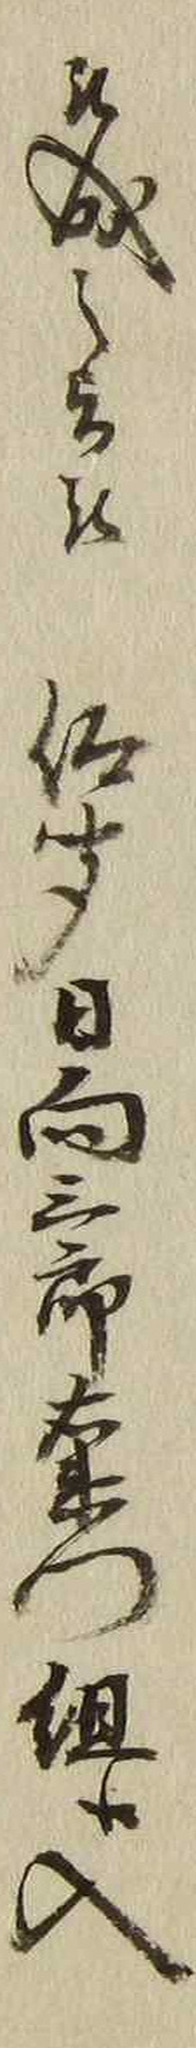被成候旨被仰聞日向三郎右衛門組江入
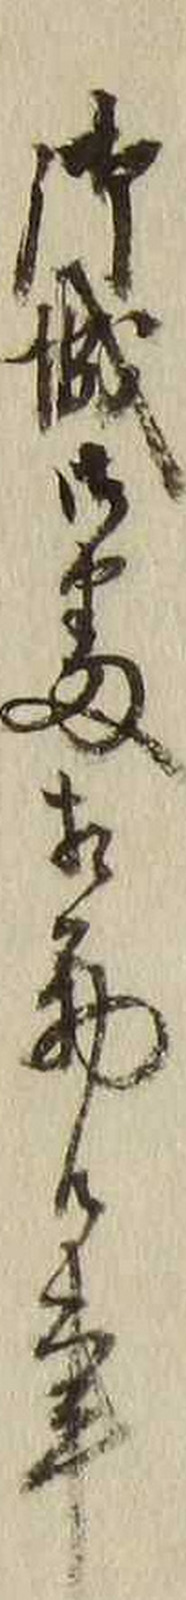御城御番相勤候事
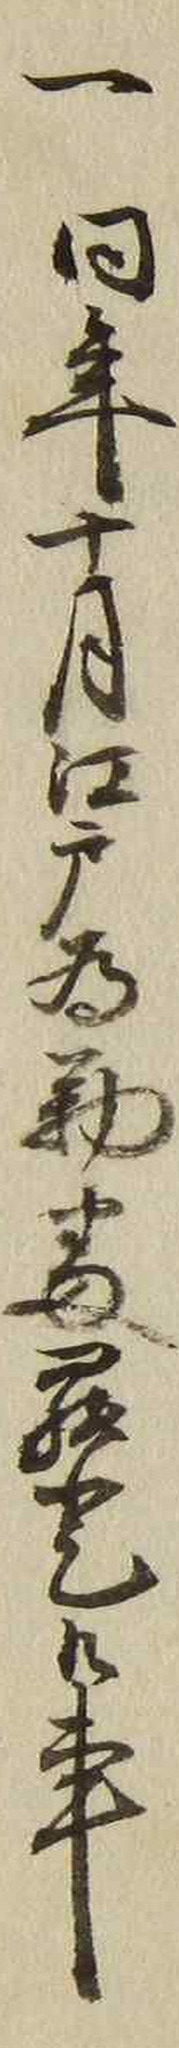一同年十月江戸為勤番罷登候事

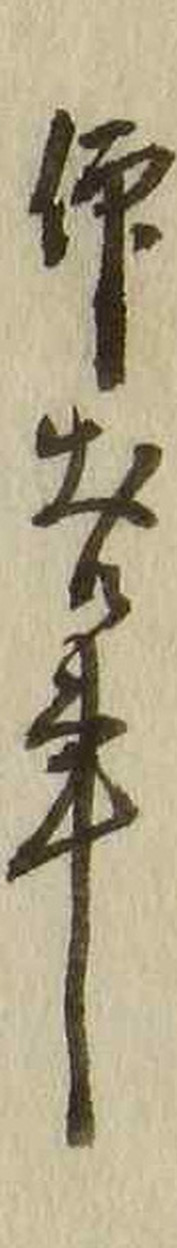仰出候事
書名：諸士系譜　巻之64　と之部7
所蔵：会津若松市立会津図書館
